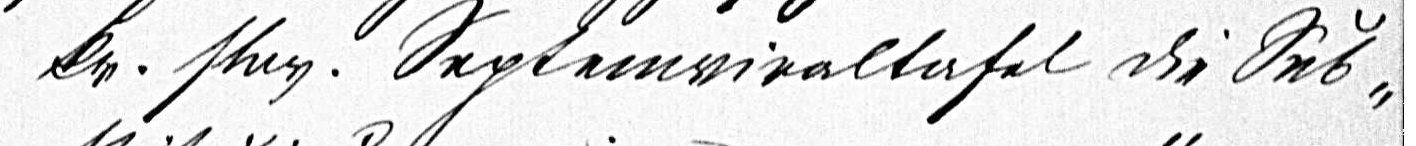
kr. slav. Septemviraltafel die Sub¬
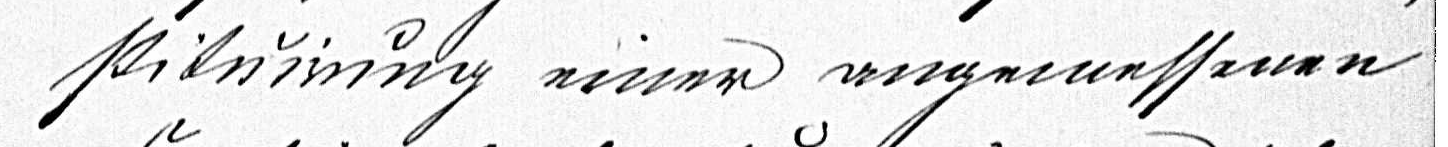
stituirung einer angemessenen
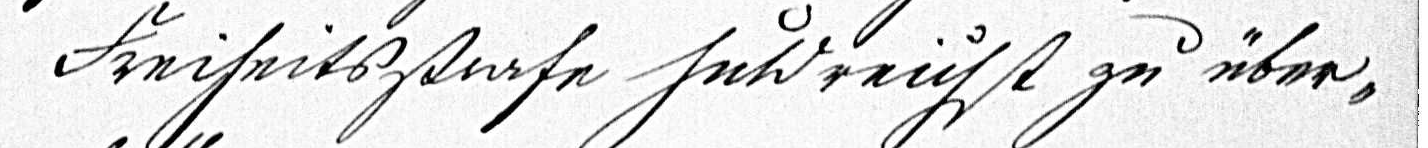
Freiheitsstrafe huldreichst zu über¬
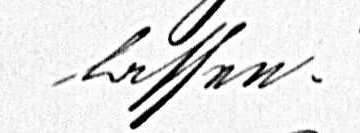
lassen.
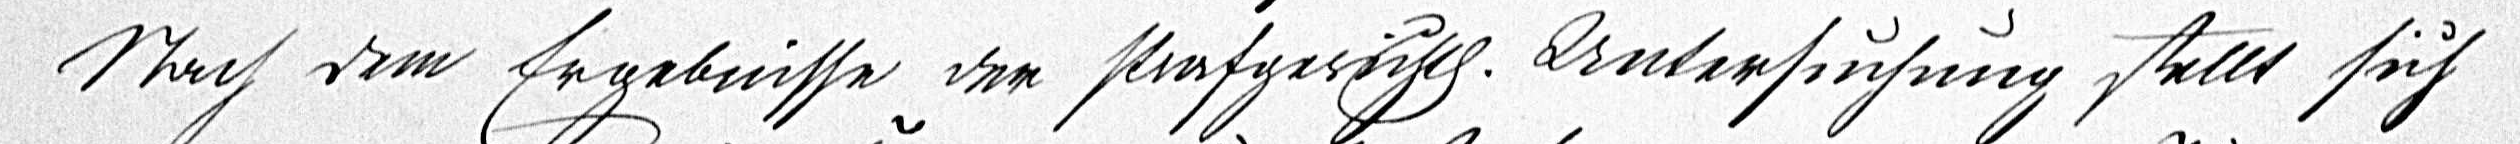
Nach dem Ergebnisse der strafgerichtl. Untersuchung stellt sich
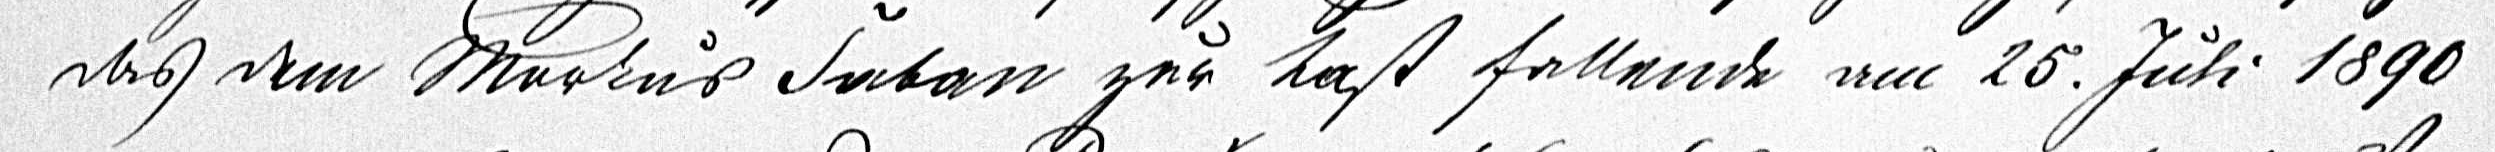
das dem Markus Šaban zur Last fallende am 25. Juli 1890
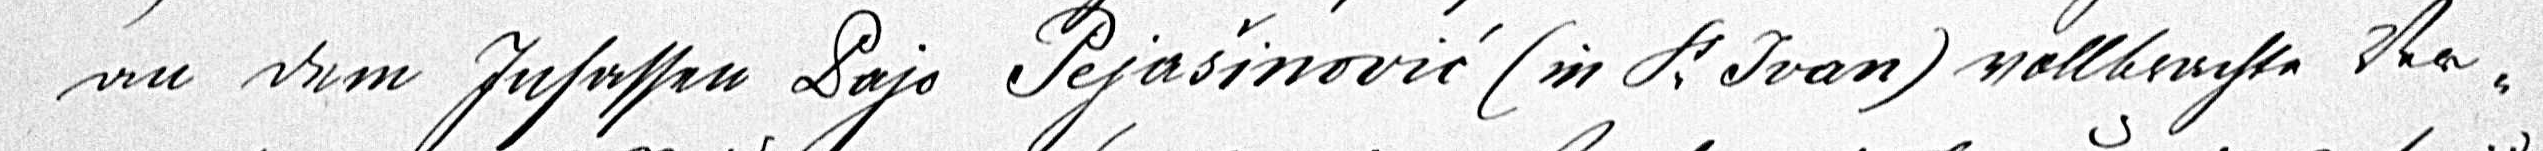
an dem Insassen Dajo Pejašinović (in St. Ian) vollbrachte Ver¬
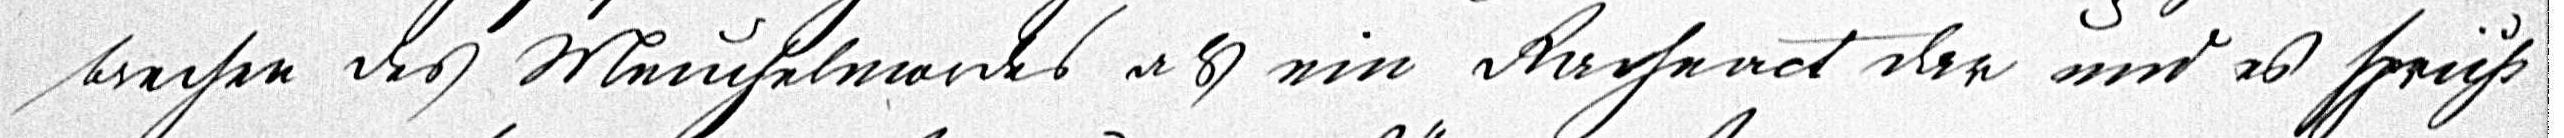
brechen des Meuchelmordes als ein Racheact dar und es spricht
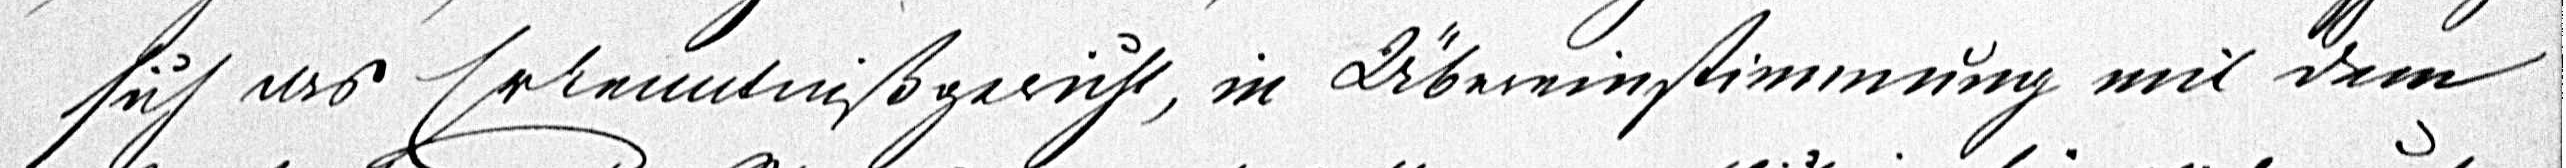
sich das Erkenntnißgericht, in Übereinstimmung mit dem
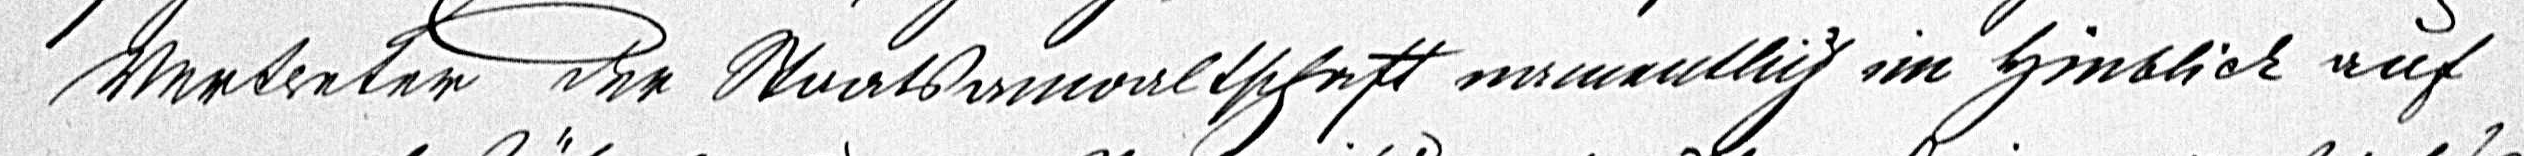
Vertreter der Staatsanwaltschaft namentlich im Hinblick auf
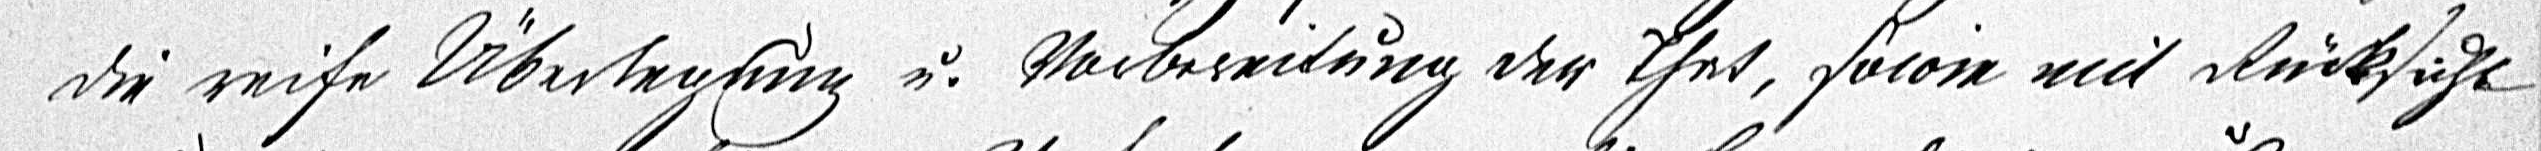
die reife Überlegung u. Vorbereitung der That, sowie mit Rücksicht
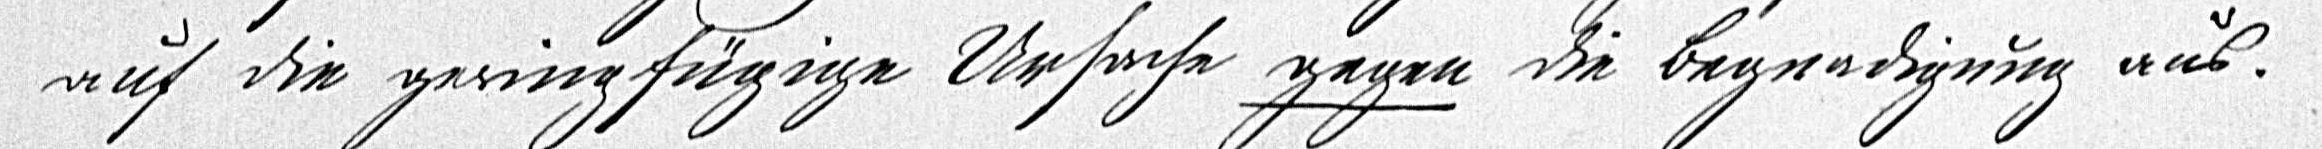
auf die geringfügige Ursache gegen die Begnadigung aus.
